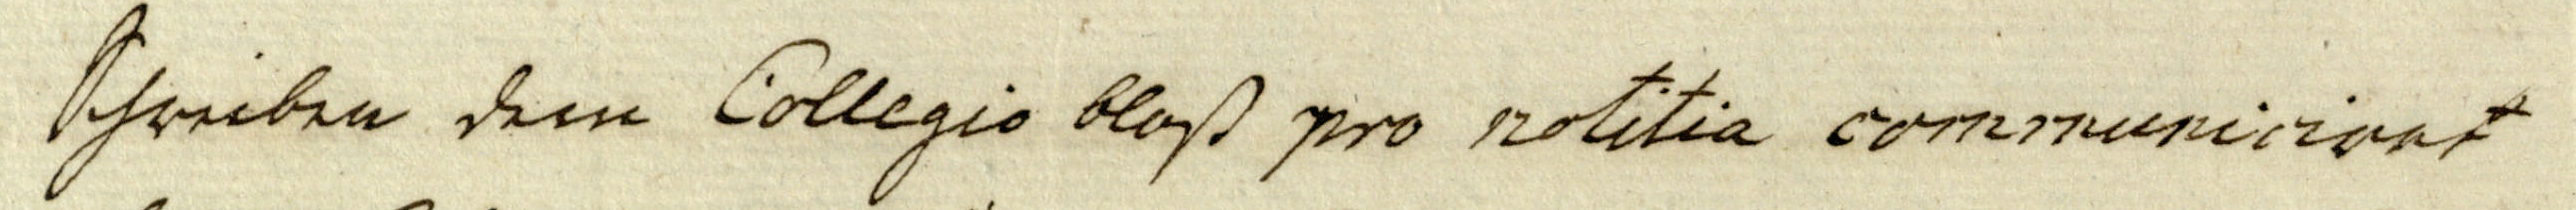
Schreiben dem Collegio bloß pro notitia communiciret
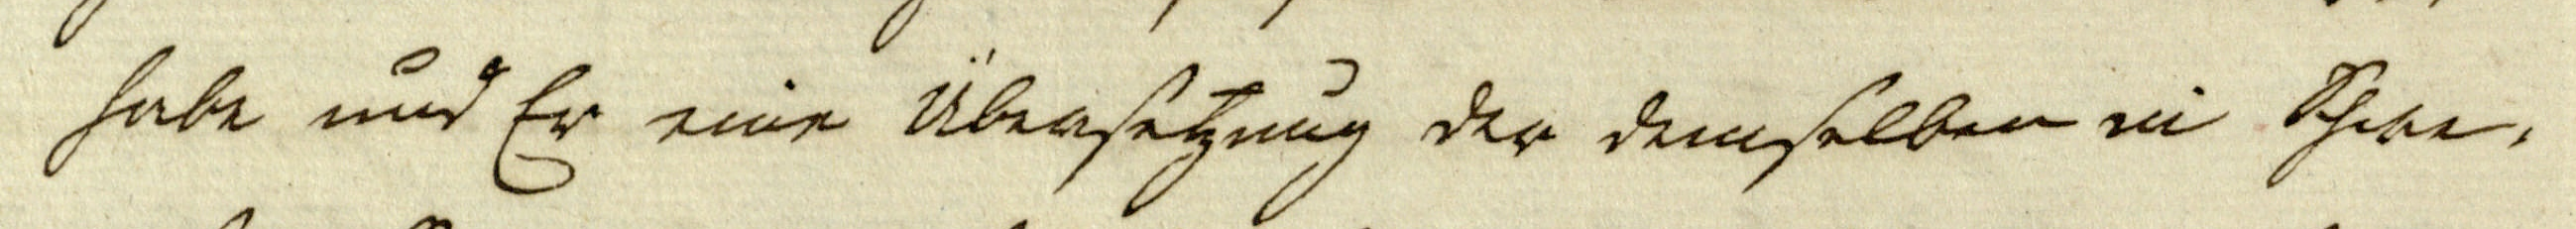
habe und Er eine Übersetzung der demselben in Schwe¬
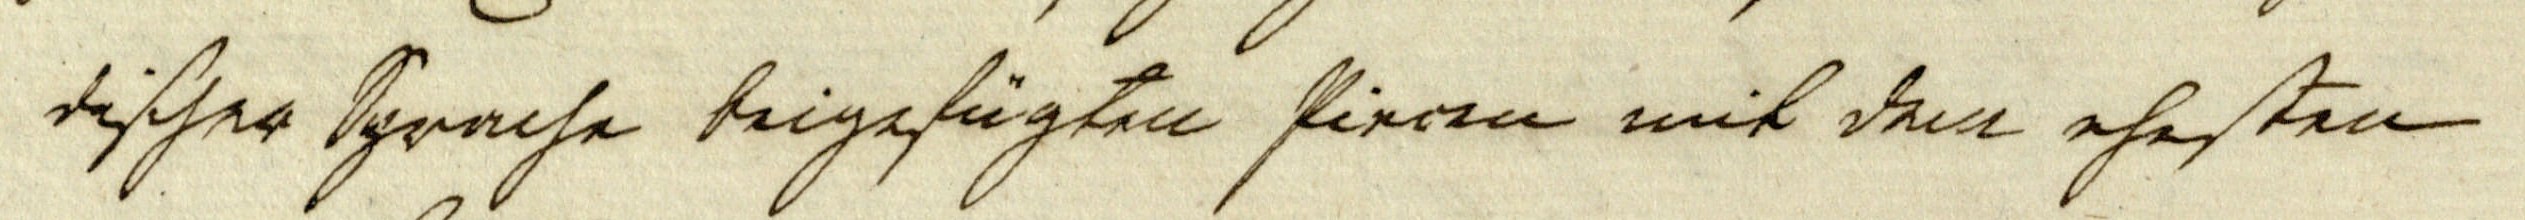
discher Sprache beigefügten Piecen mit dem ehesten
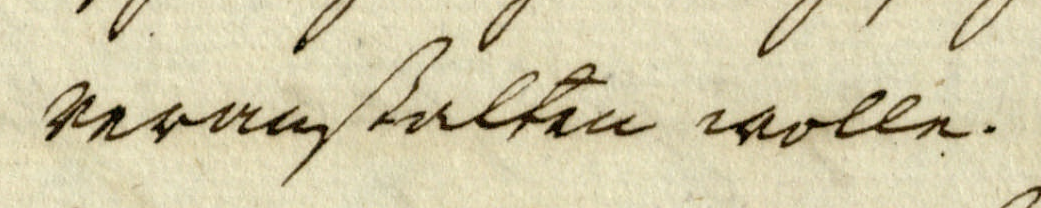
veranstalten wolle.
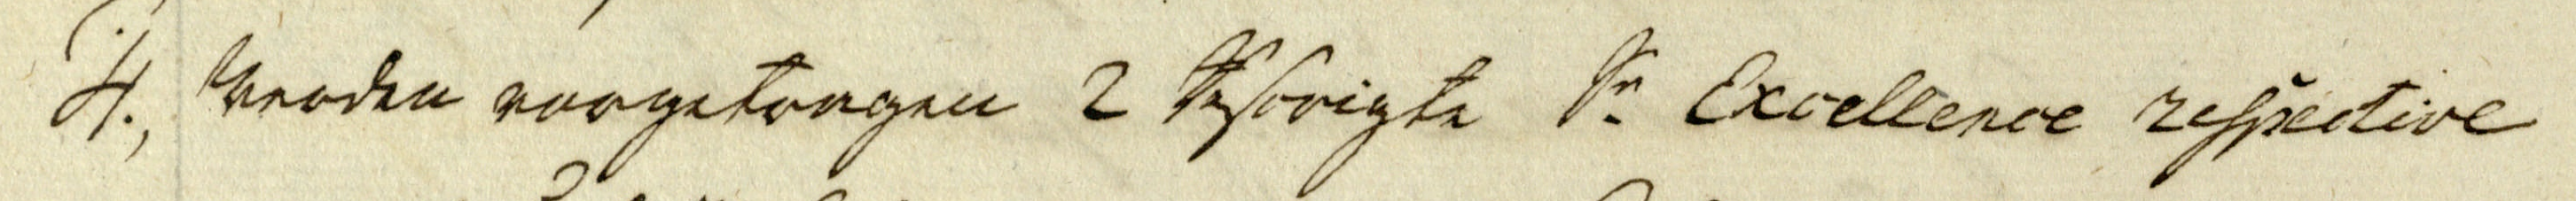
4., Werden vorgetragen 2 Rescripte Sr. Excellence respective
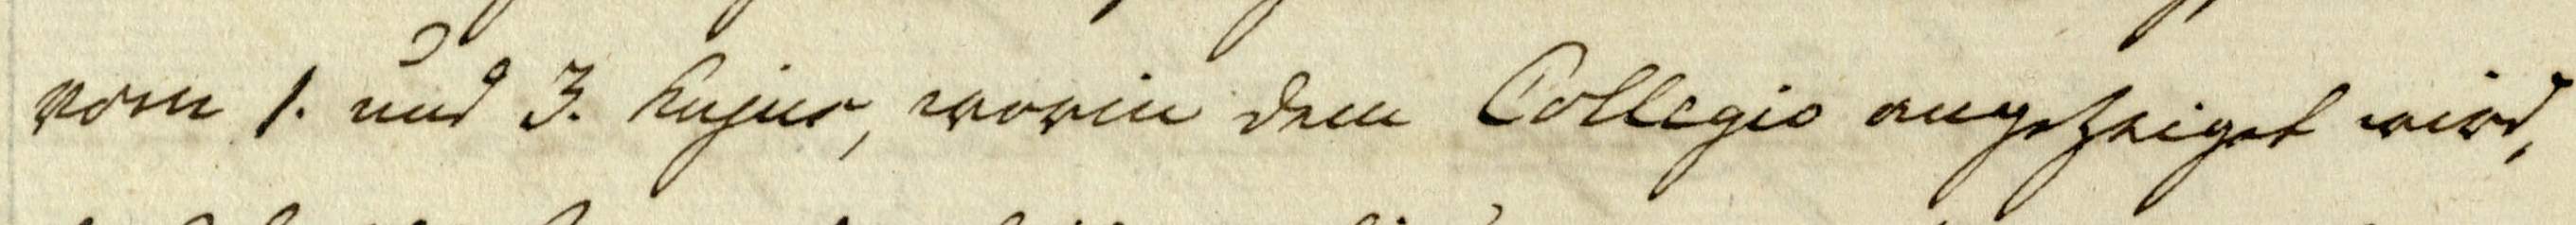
vom 1. und 3. hujus, worin dem Collegio angezeiget wird,
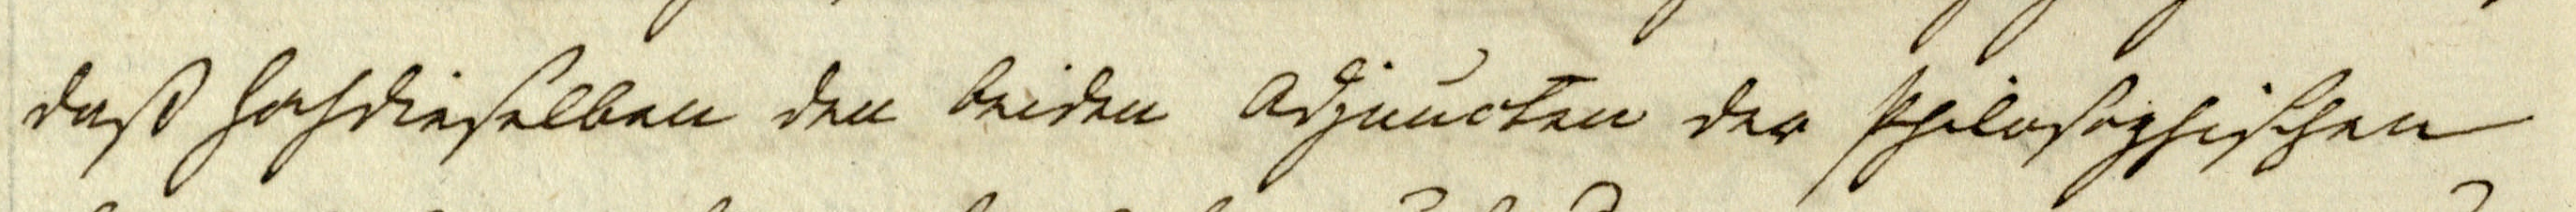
daß hochdieselben den beiden Adjuncten der Philosophischen
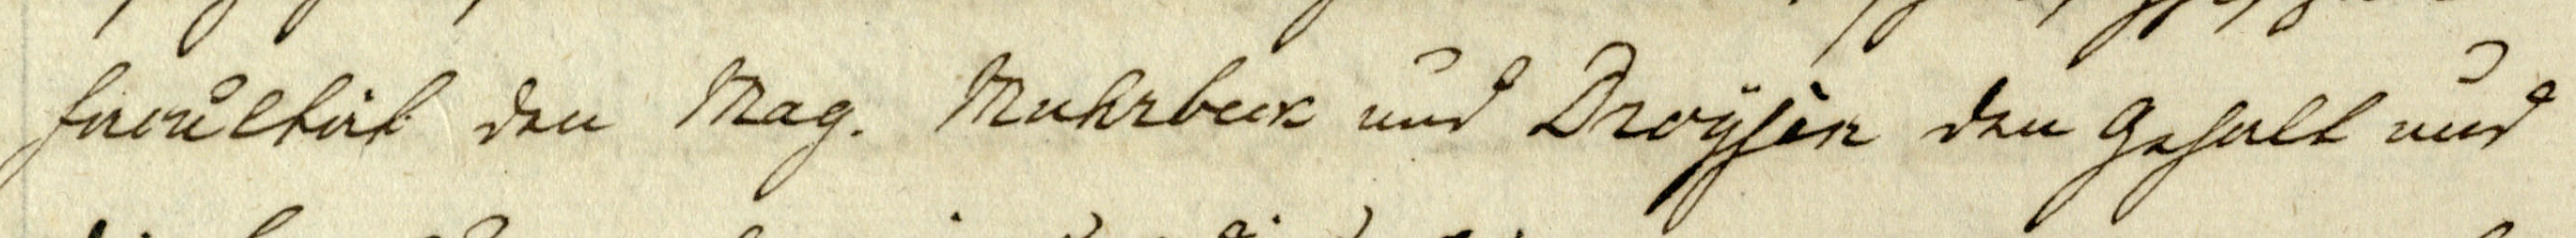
Facultät den Mag. Muhrbeck und Droÿsen den Gehalt und
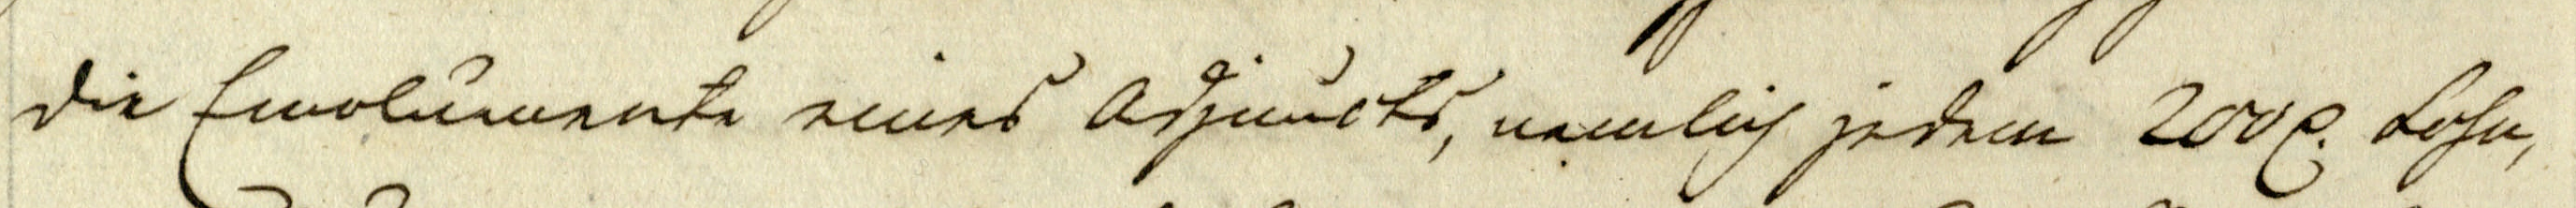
die Emolumente eines Adjuncts, nemlich jedem 200 l. Lohn,
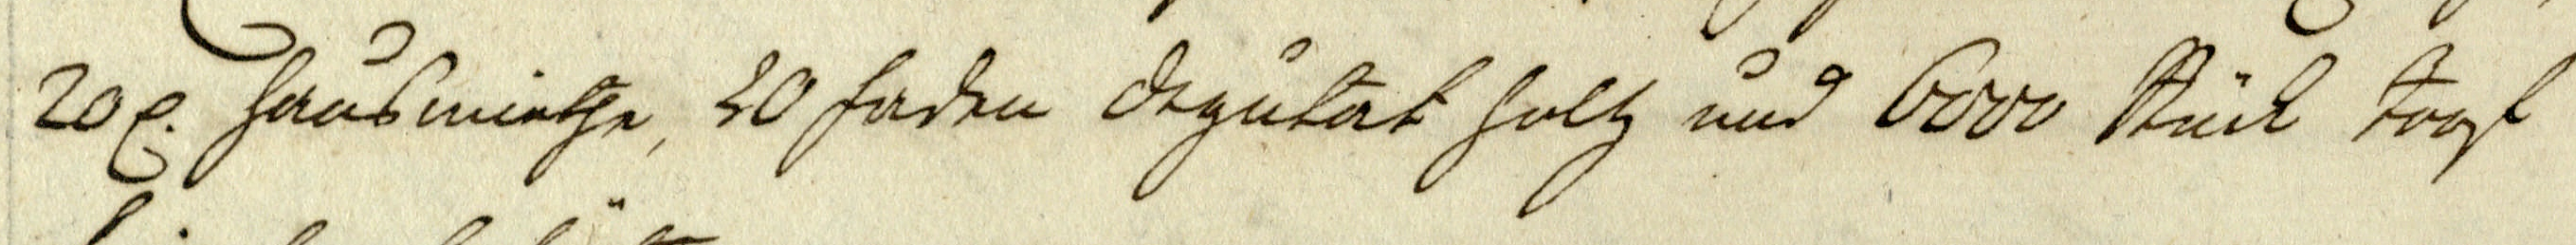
20 l. hausmiethe, 20 Faden Deputat holz und 6000 Stück Torf
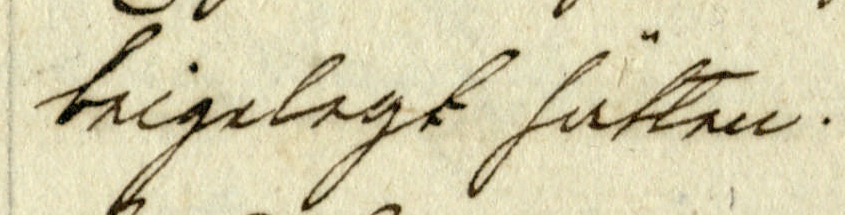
beigelegt hätten.
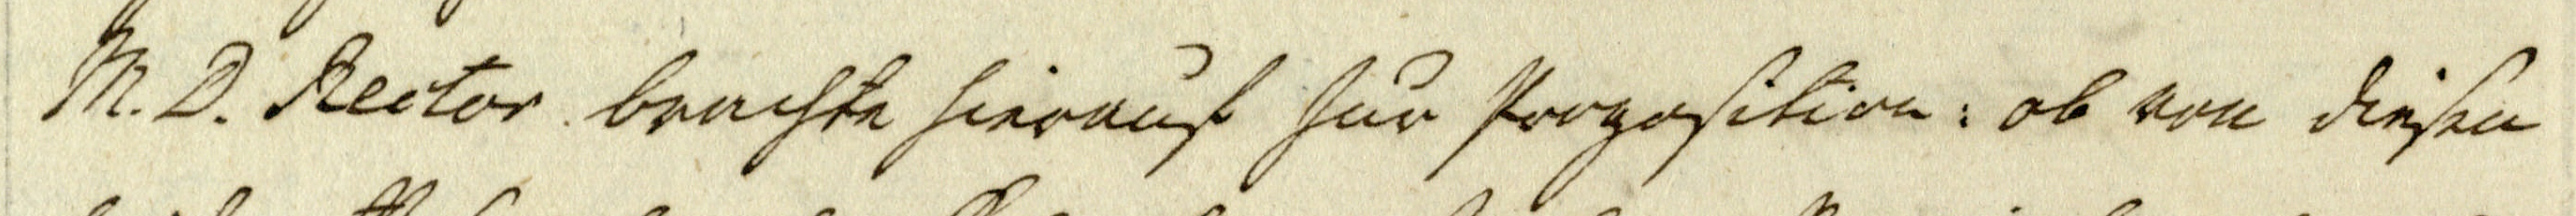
M. D. Rector brachte hierauf zur Proposition: ob von diesen
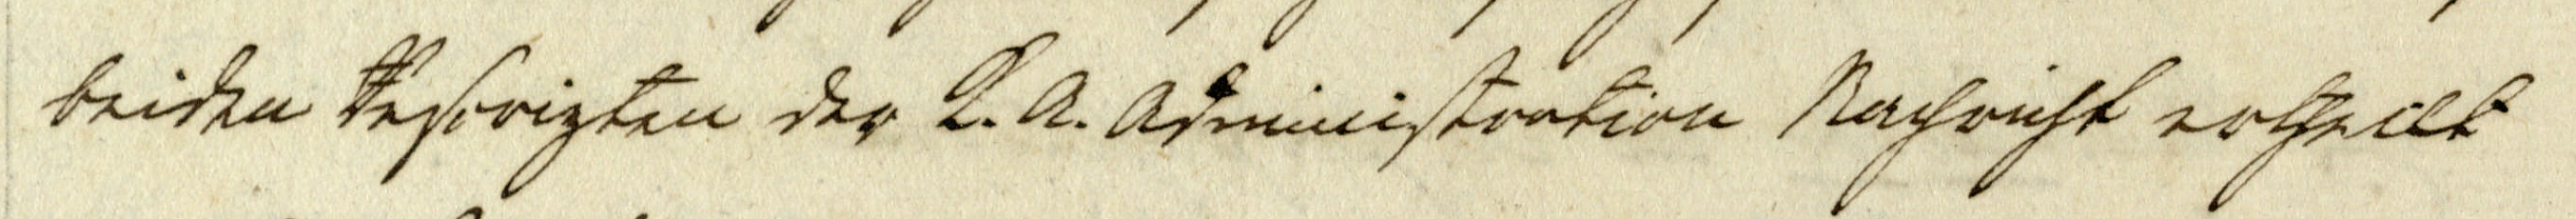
beiden Rescripten der K. A. Administration Nachricht ertheilt
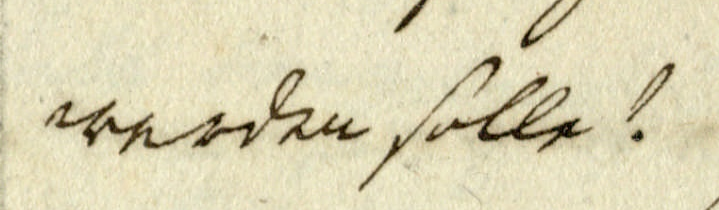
werden solle!
